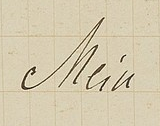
Mein
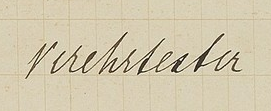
verehrtester
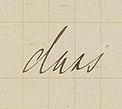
Von
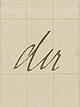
«es
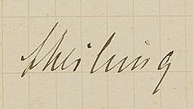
Ministerium
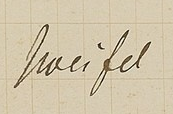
von den
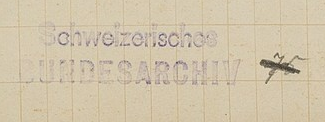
genommen, dass
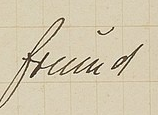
Zeit finde.»
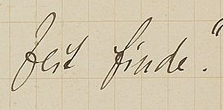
machte beruht
